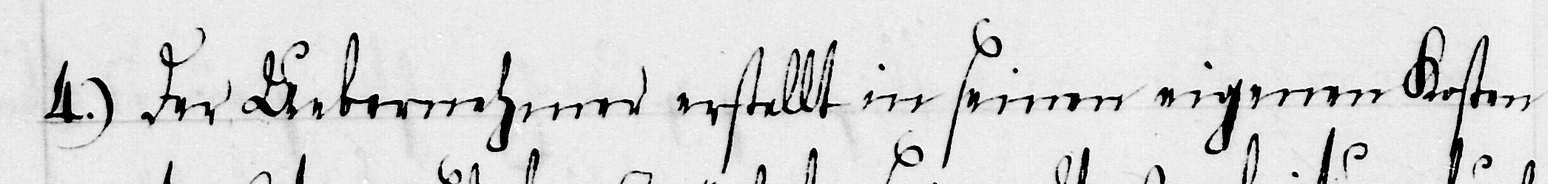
4.) Der Uebernehmer erstellt in seinen eigenen Kosten
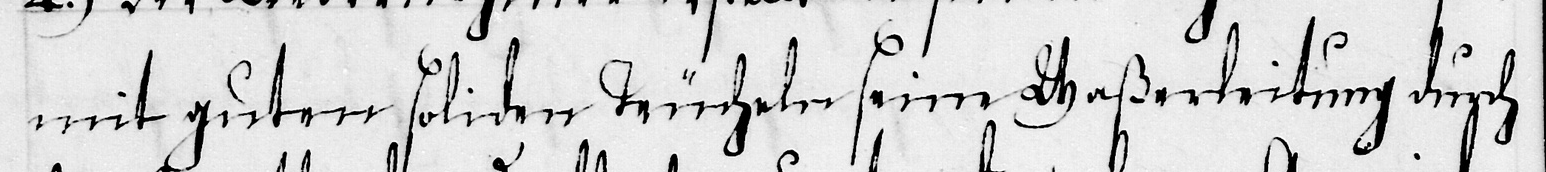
mit guten soliden Teucheln seine Waßerleitung durch
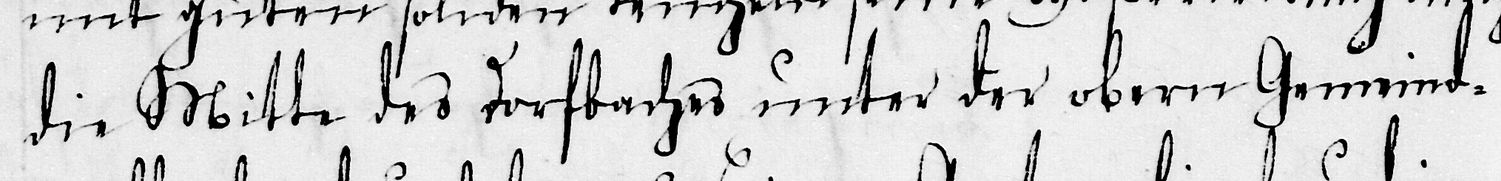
die Mitte des Dorfbaches unter der obern Gemeinds¬
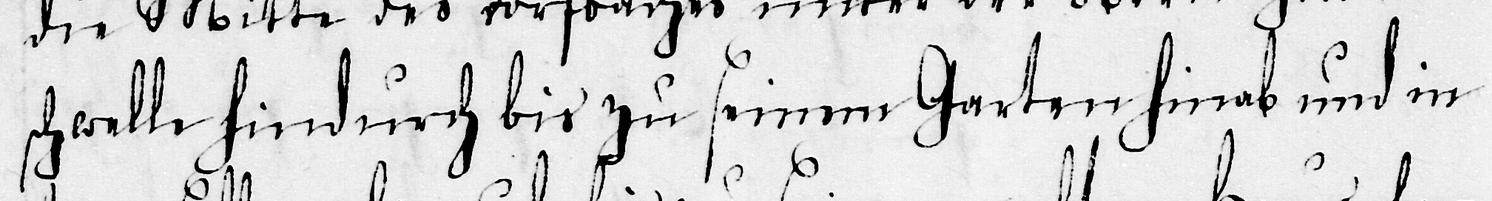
chwelle hindurch bis zu seinem Garten hinab und in
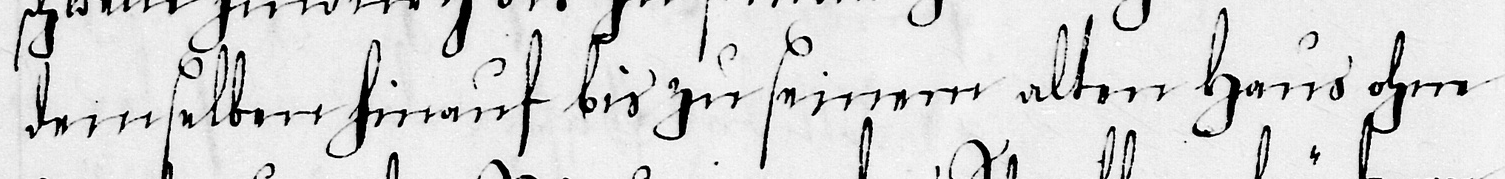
demselben hinauf bis zu seinem alten Haus ohne
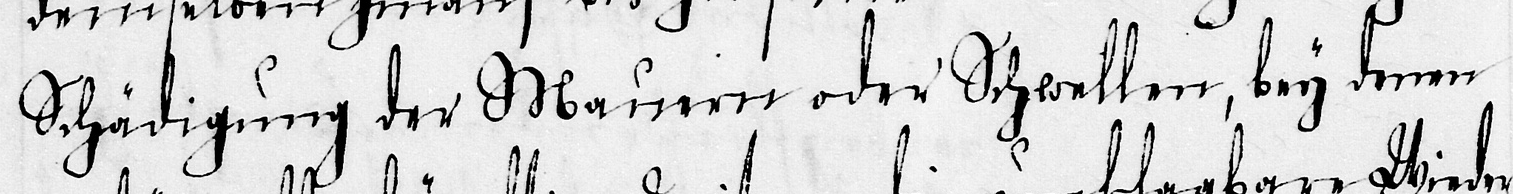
Schädigung der Mauern oder Schwellen, bey denen
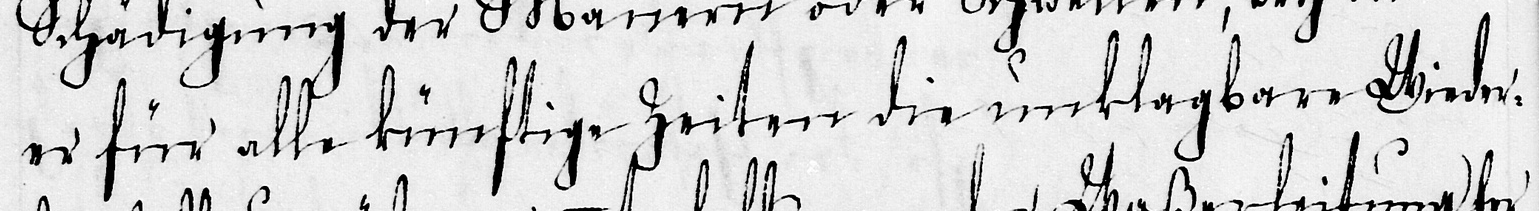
er für alle künftige Zeiten die unklagbare Wieder¬
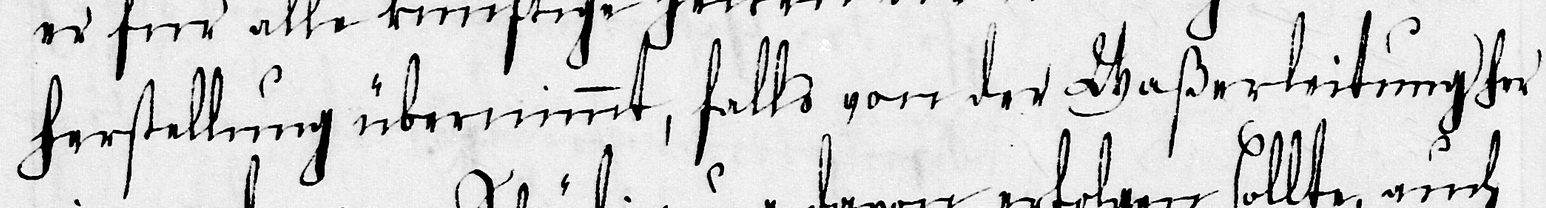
herstellung übernimmt, falls von der Waßerleitung her
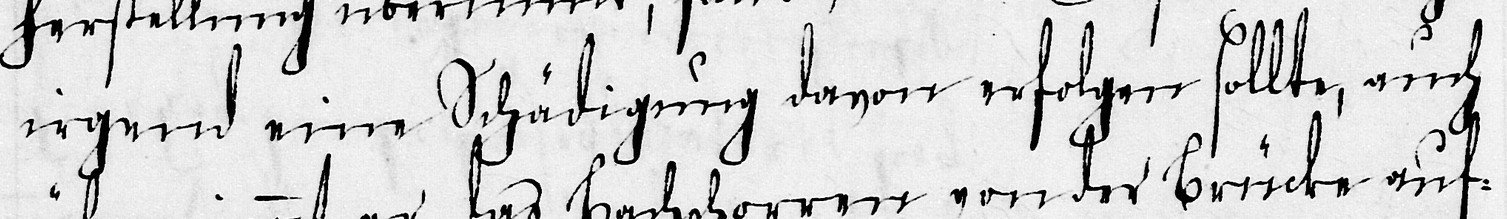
irgend eine Schädigung davon erfolgen sollte, auch
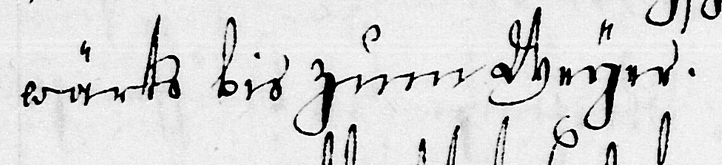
wärts bis zum Weyer.
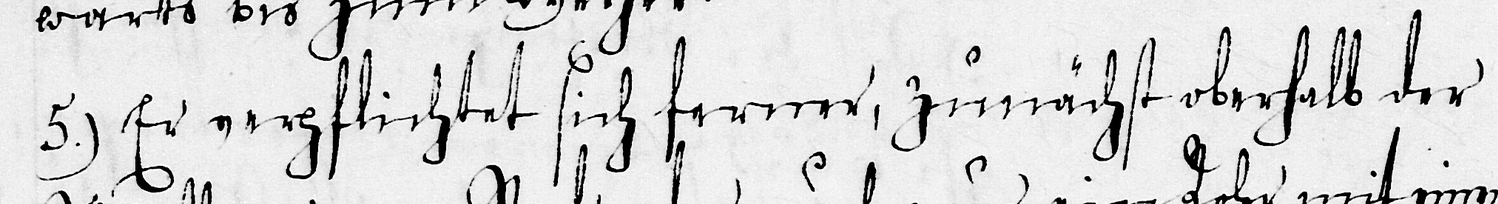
5.) Er verpflichtet sich ferner, zunächst oberhalb der
